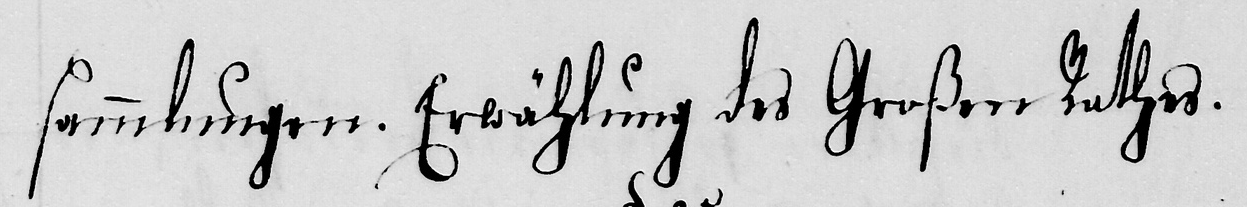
sammlungen. Erwählungen des Großen Rathes.
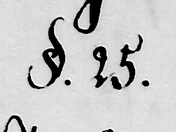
§. 25.
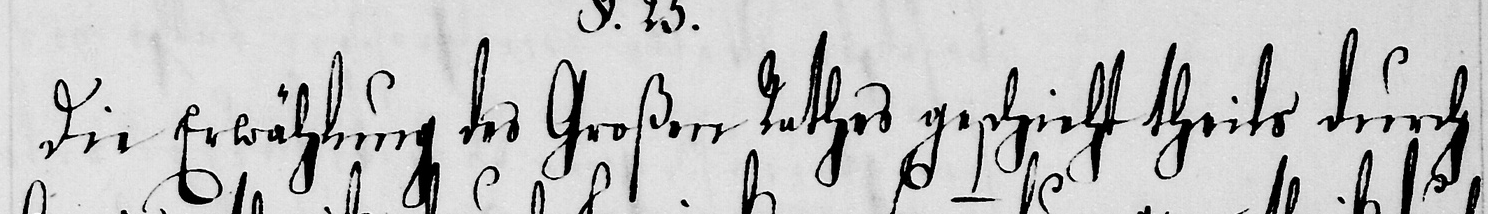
Die Erwählung des Großen Rathes geschieht theils durch
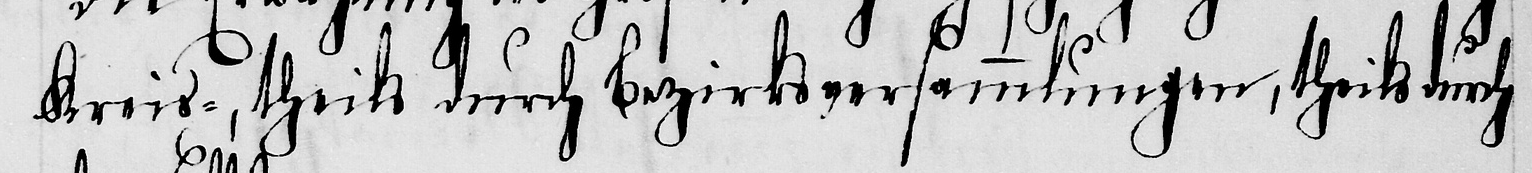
Kreis-, theils durch Bezirksversammlungen, theils durch
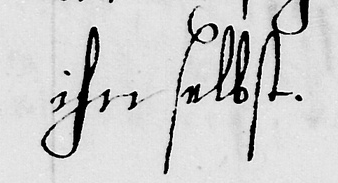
ihn selbst.
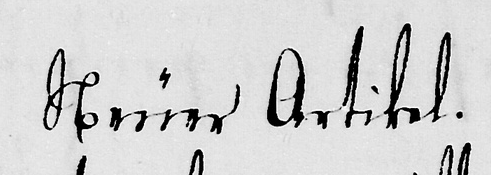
Neuer Artikel.
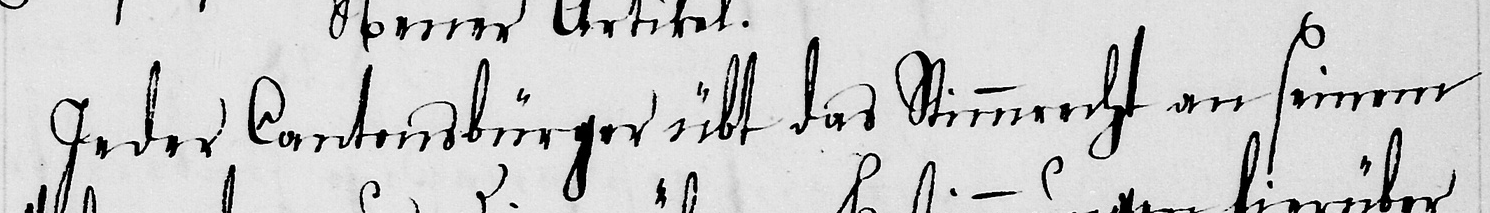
Jeder Cantonsbürger übt das Stimmrecht an seinem
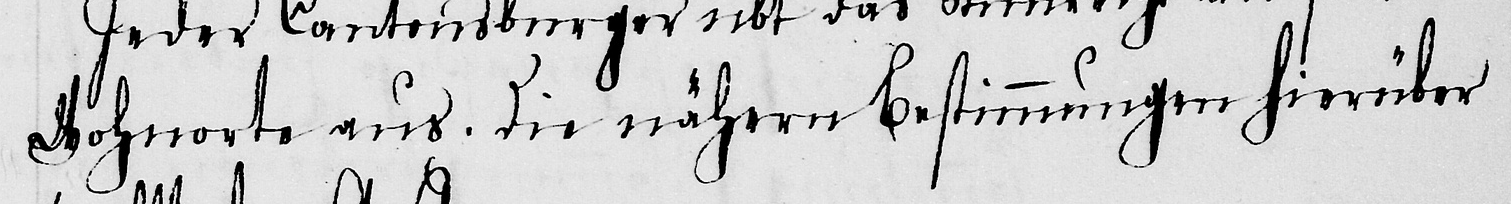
Wohnorte aus. Die nähern Bestimmungen hierüber
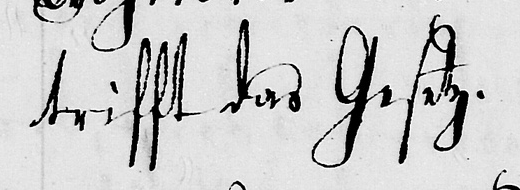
trifft das Gesetz.
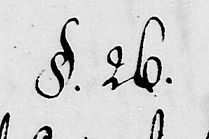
§. 26.
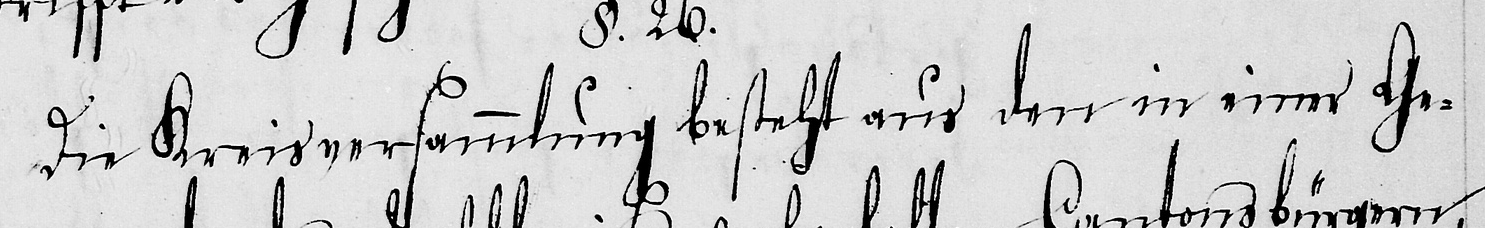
Die Kreisversammlung besteht aus den in einer Ge¬
